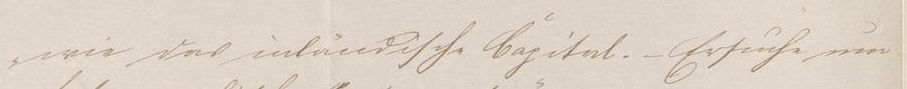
wie das inländische Capital. Ersuche nun
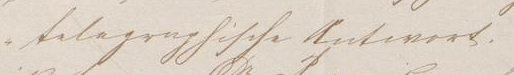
telegraphische Antwort.»
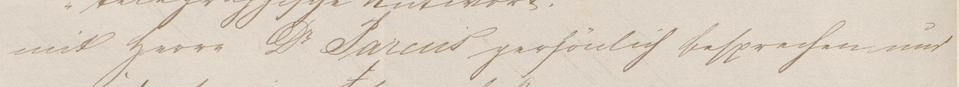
mit Herrn DrParcus persönlich besprechen und
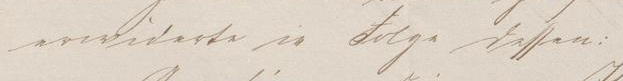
erwiderte in Folge dessen:
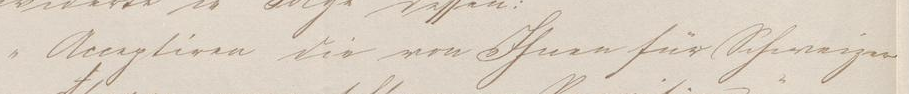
«Acceptiren die von Ihnen für Schweizer
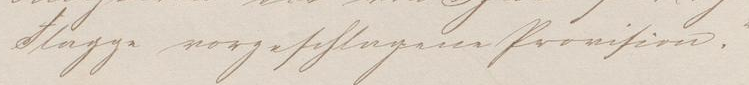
Flagge vorgeschlagene Provision.»
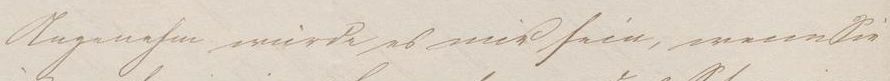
Angenehm würde es mir sein, wenn Sie
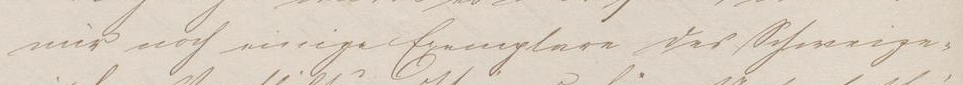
mir noch einige Exemplare des Schweize-
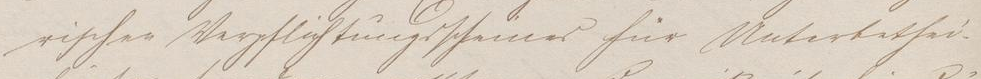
rischen Verpflichtungscheines für Unterbethei-
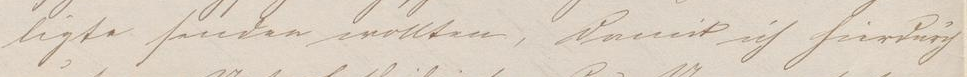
ligte senden wollten, damit ich hierdurch
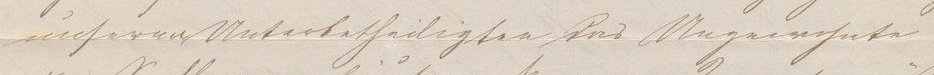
unseren Unterhbetheiligten das Ungewohnte
